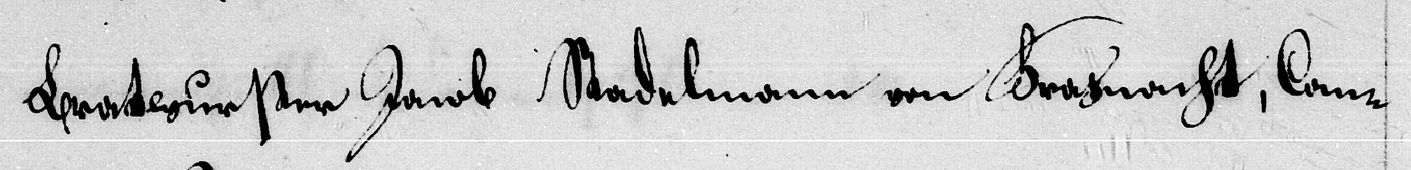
Bratwurster Jacob Stadelmann von Frasnacht, Can¬
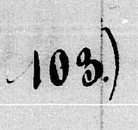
108.)
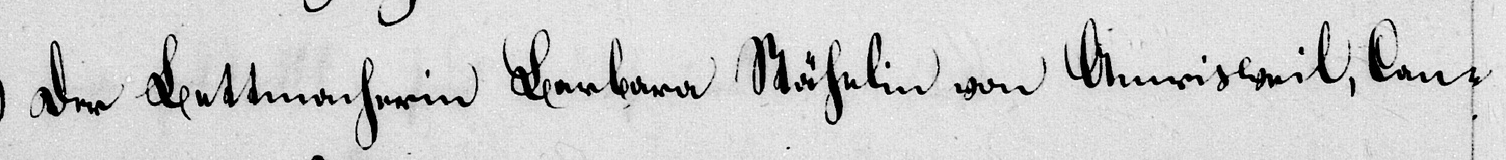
Der Bettenmacherin Barbara Stähelin von Amrisweil, Can¬
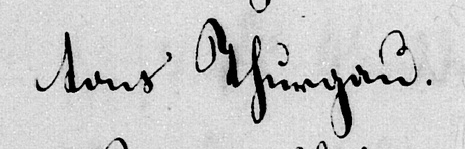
tons Thurgau.
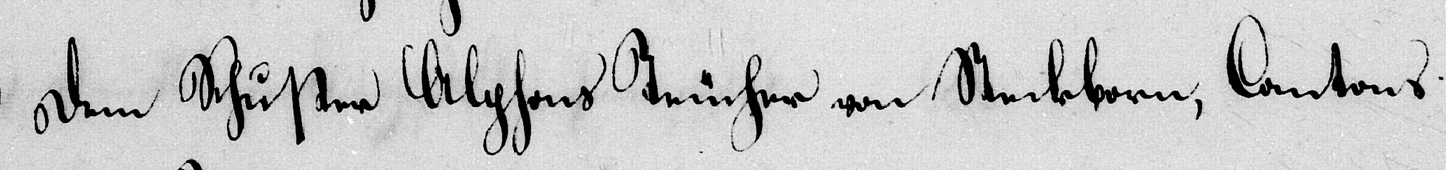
Dem Schuster Alphons Teucher von Steckborn, Cantons
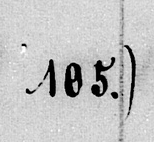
105.)
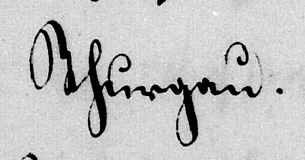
Thurgau.
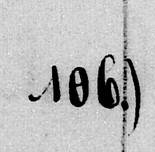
106.)
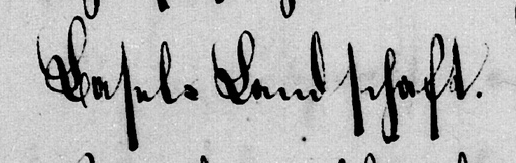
Basel-Landschaft.
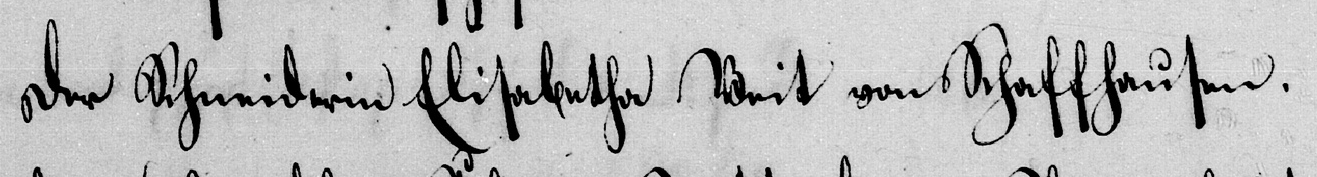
Der Schneiderin Elisabetha Veit von Schaffhausen.
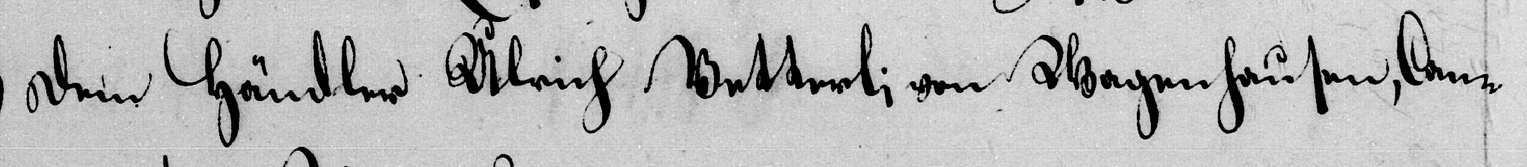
Dem Händler Ulrich Vetterli von Wagenhausen, Can¬
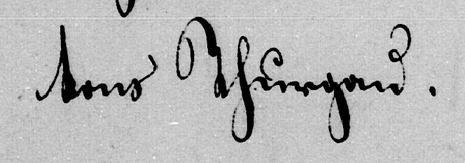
tons Thurgau.
